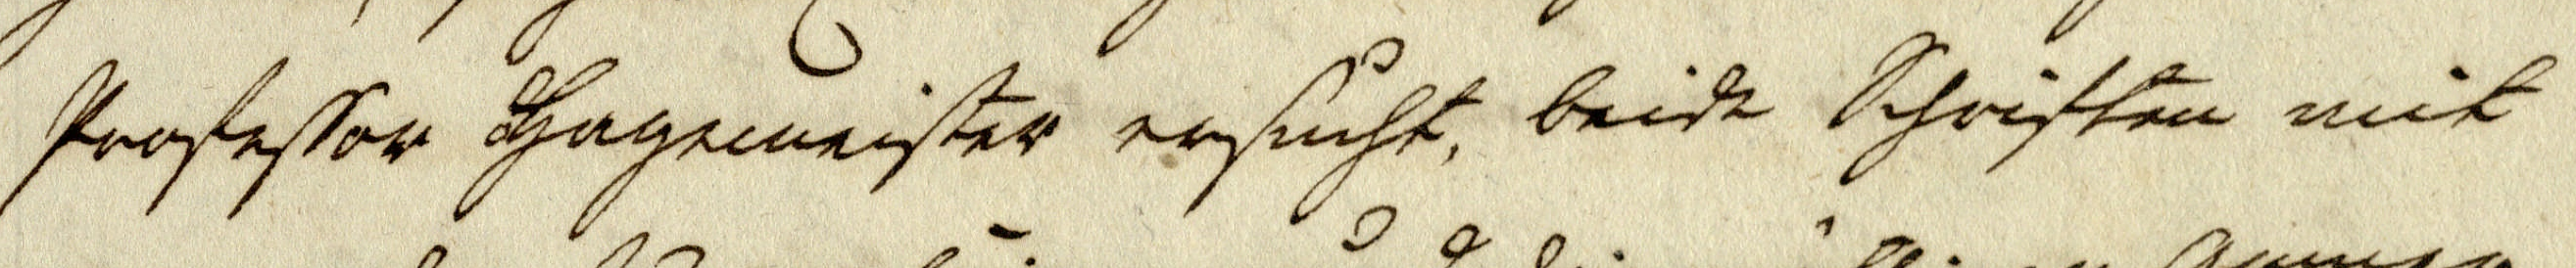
Professor Hagemeister ersucht, beide Schriften mit
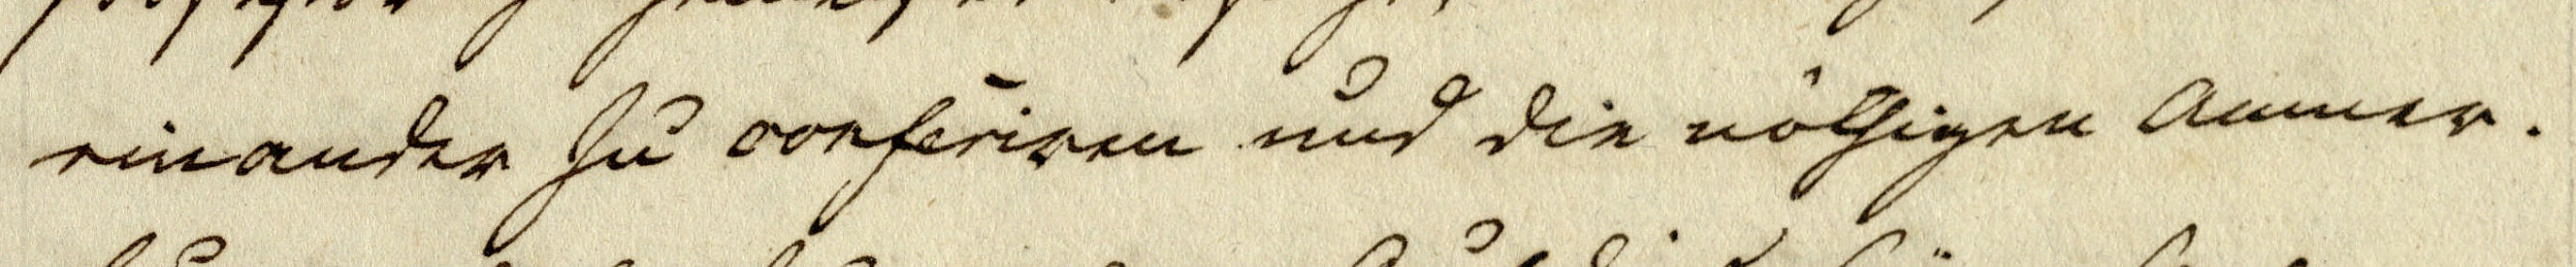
einander zu conferiren und die nöthigen Anmer¬
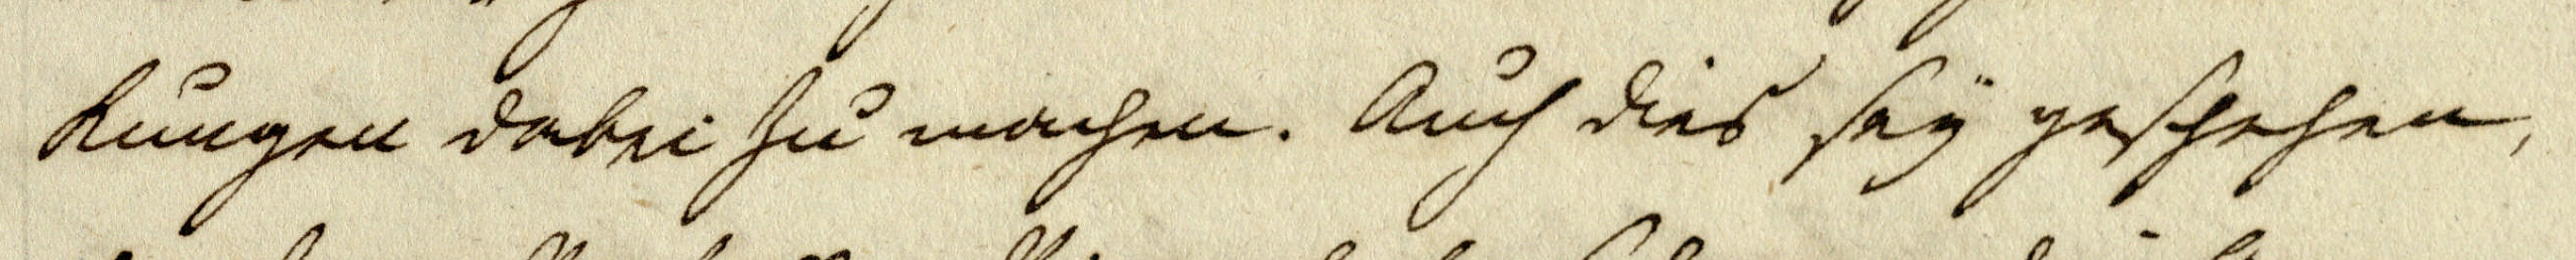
kungen dabei zu machen. Auch dies seÿ geschehen,
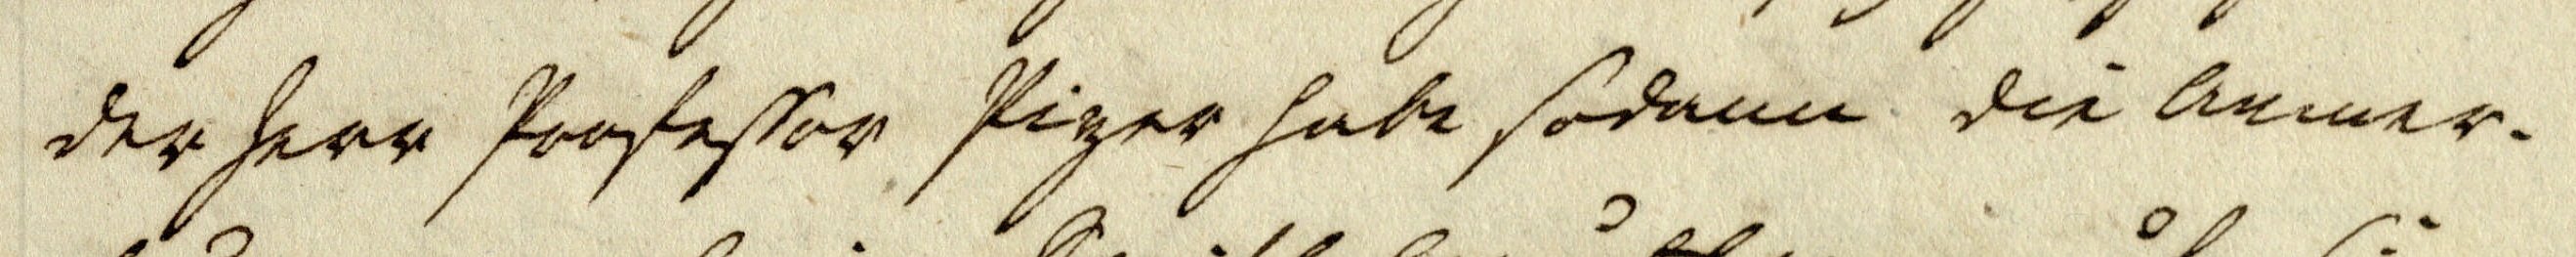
der Herr Professor Piper habe sodann die Anmer¬
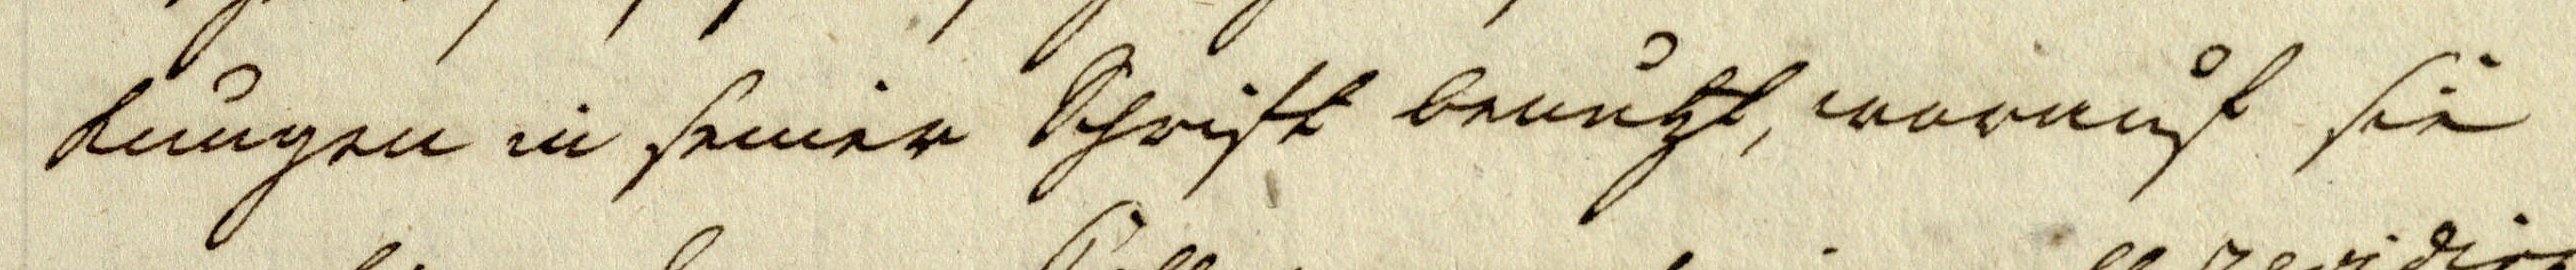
kungen in seiner Schrift benutzt, worauf sie
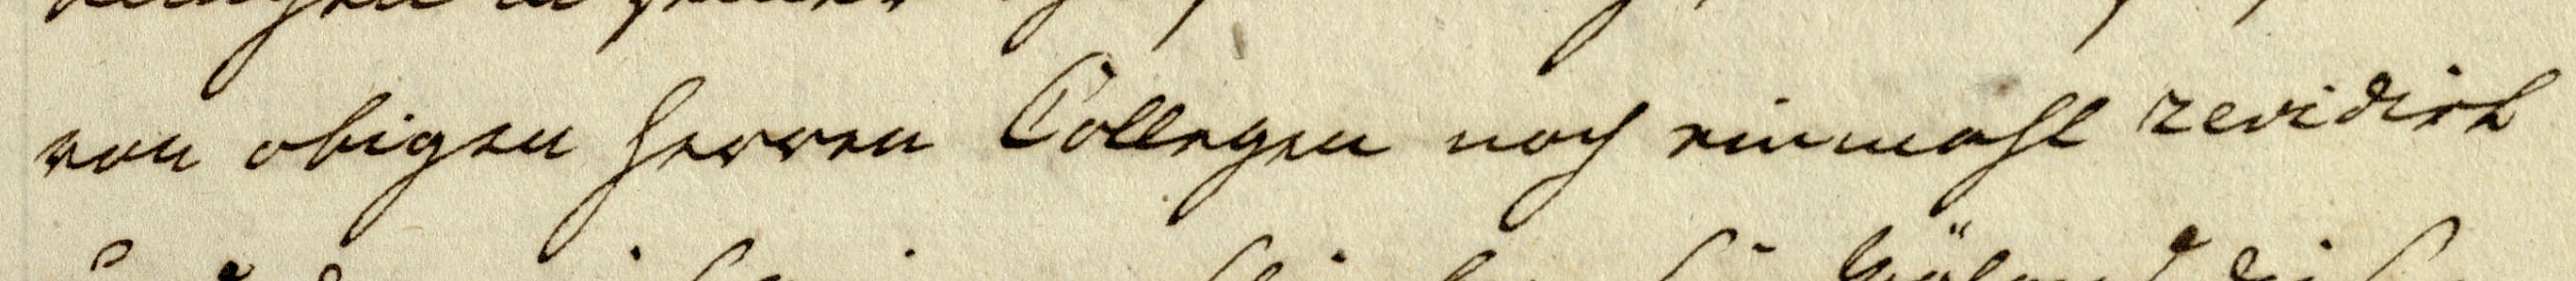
von obigen Herren Collegen noch einmahl revidirt
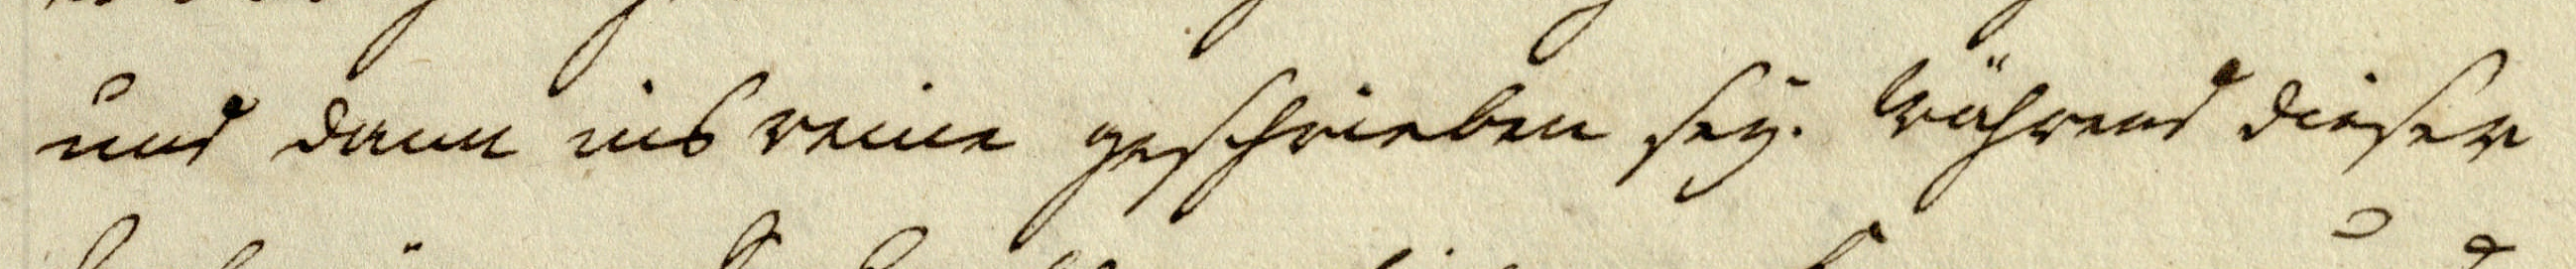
und dann ins reine geschrieben seÿ. Während dieser
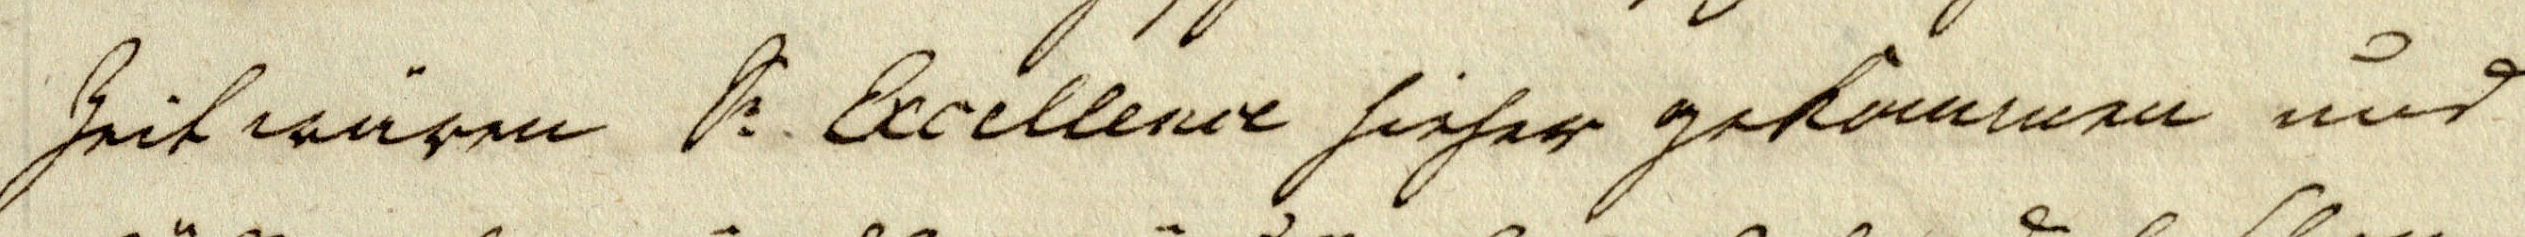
Zeit wären Sr Excellence hieher gekommen und
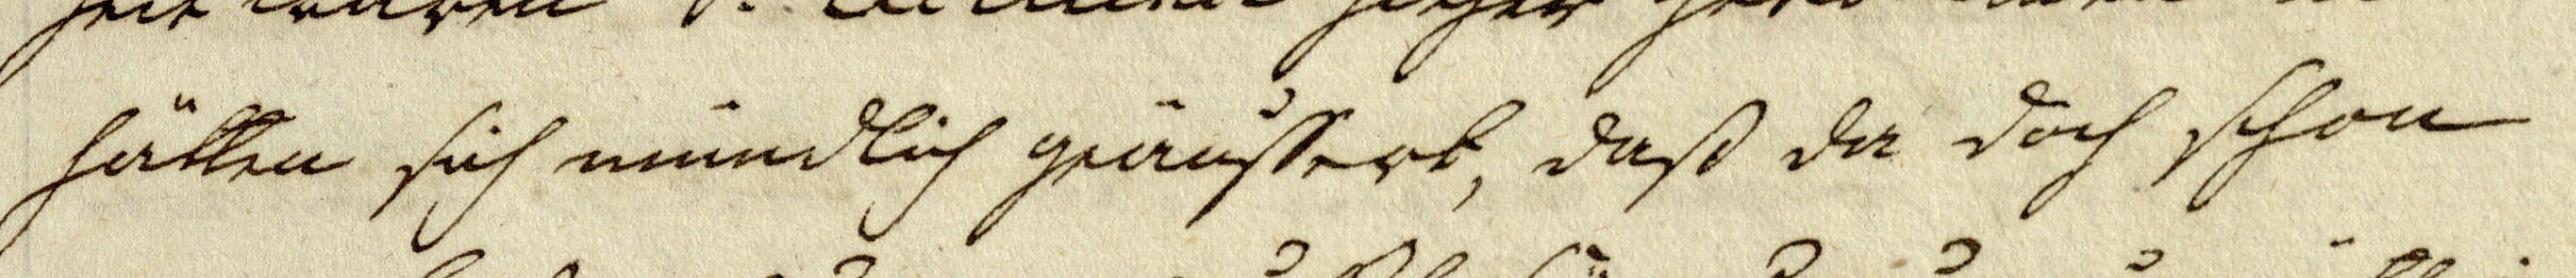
hätten sich mündlich geäussert, daß da doch schon
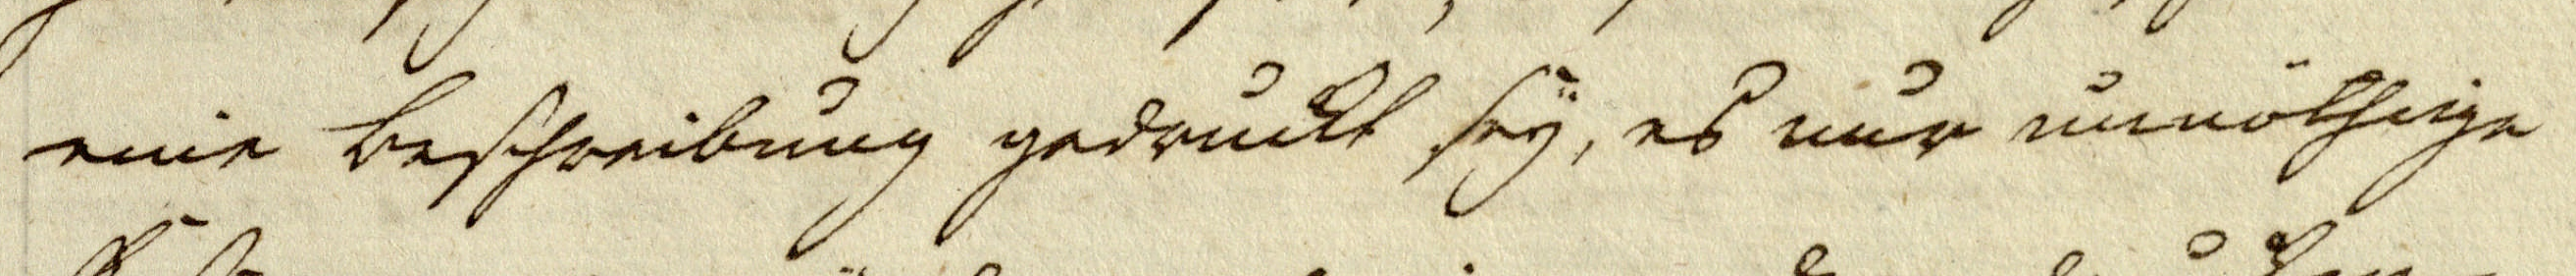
eine Beschreibung gedruckt seÿ, es nur unnöthige
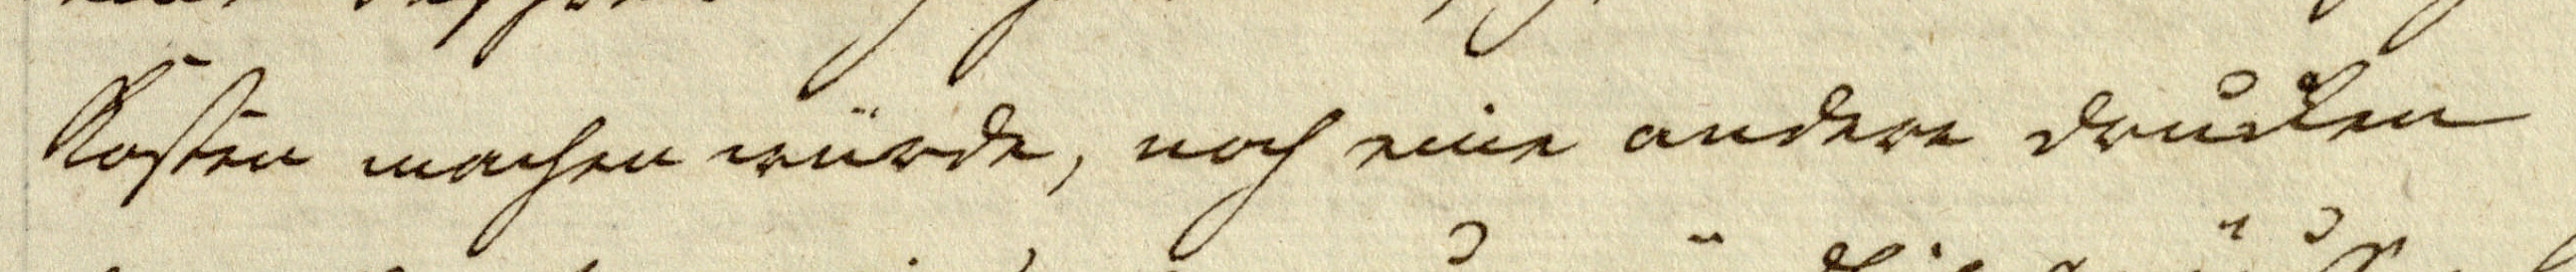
Kosten machen würde, noch eine andere drucken
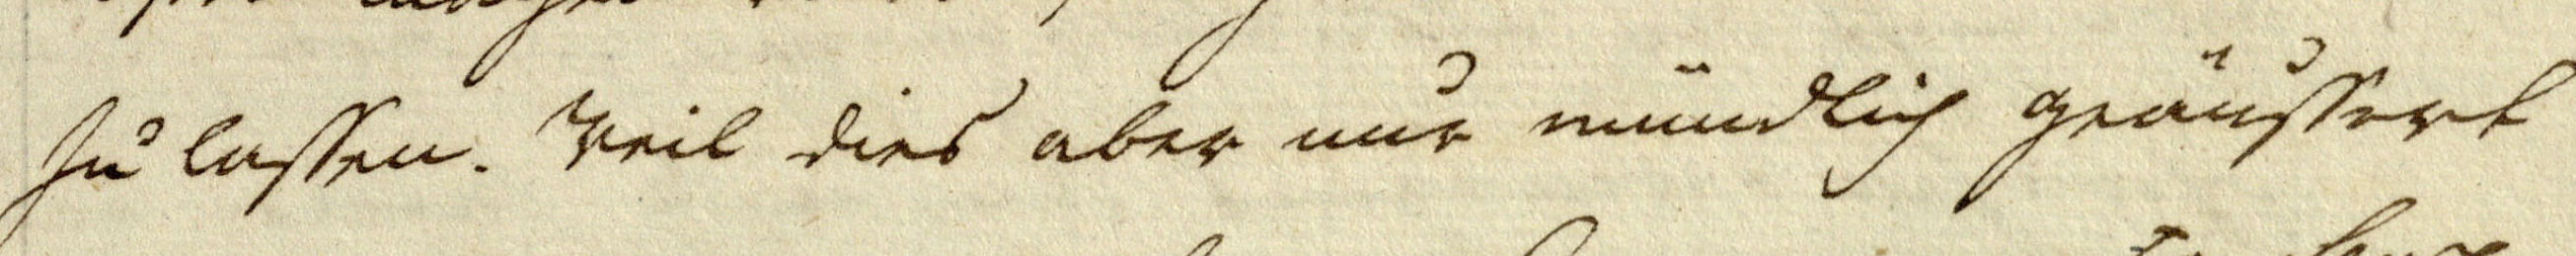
zu lassen. Weil dies aber nur mündlich geäussert
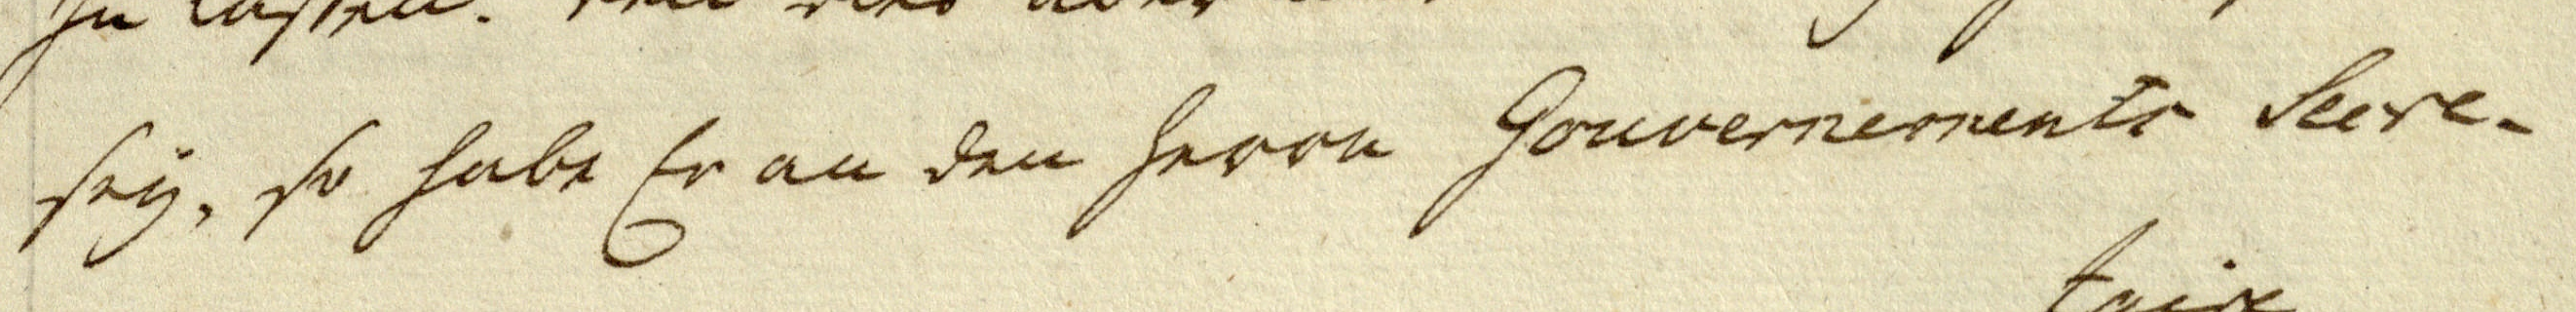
seÿ, so habe Er an den Herrn Gouvernements Secre¬
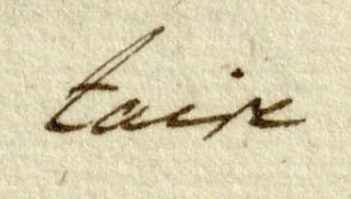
taire
